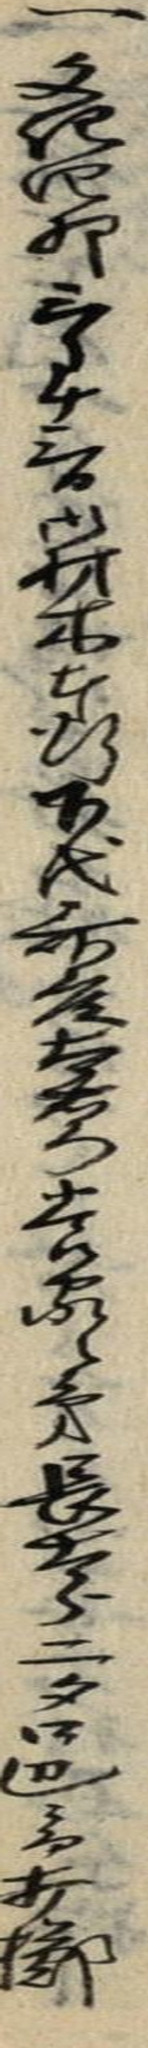一文化四卯三月十三日御材木奉行下代齋藤太右衛門養家之弟長太郎二タ口辺にて打擲
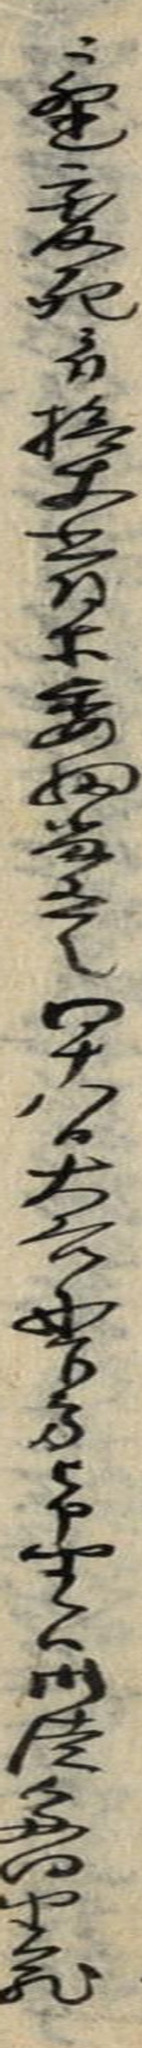に逢変死に付検使書付等委細留有之同十八日大谷丹下方被申聞候は御徒多田半蔵
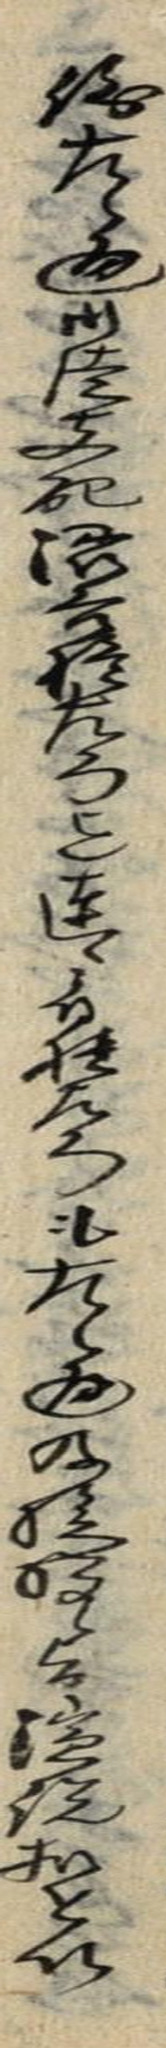儀左之通御徒支配渋谷権左衛門迄達候に付権左衛門も左之通及挨拶候旨演説扣を以
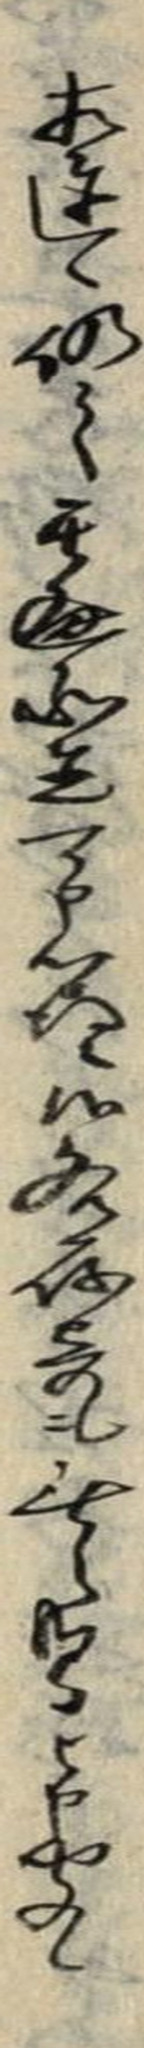相達候仍之其通承置可申心得に候各存寄も無之哉と被申聞候
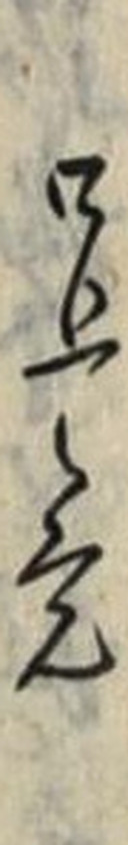口上之覚
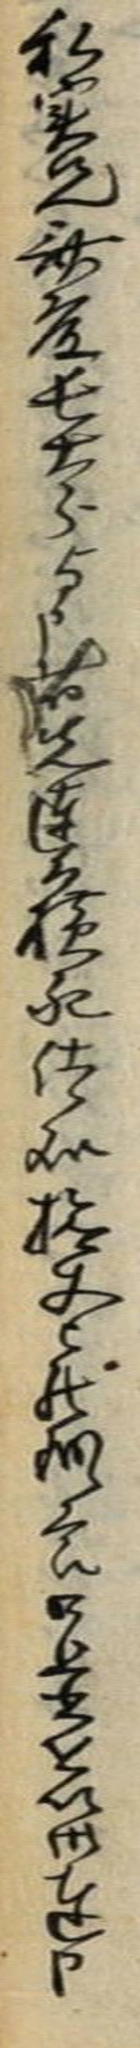私実兄齋藤長太郎と申者先達て横死仕候処検使被罷越候節口上書を以御達申
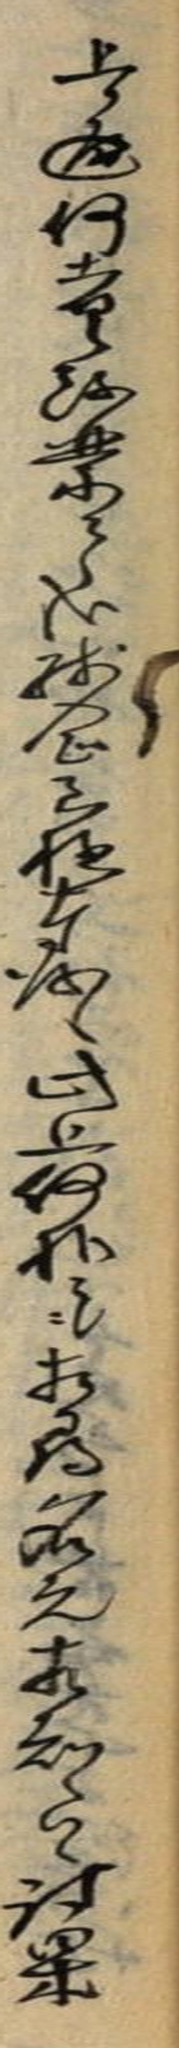上候通何者之致業に候哉残念至極奉存候此上何様にも相尋名元相知候はゝ討果
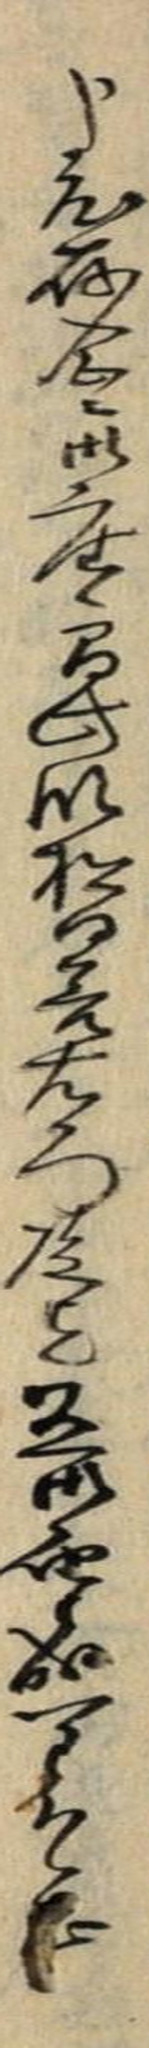申度存念に御座候間此段松田善右衛門殿迄宜御届被成可被下候以上
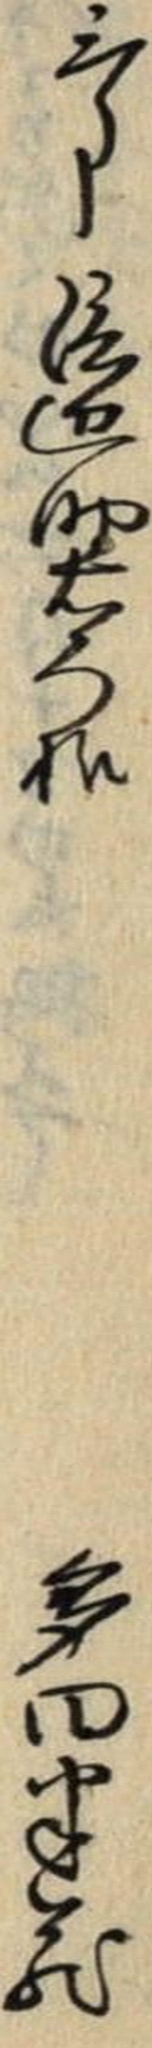三月渡辺助右衛門様多田半蔵
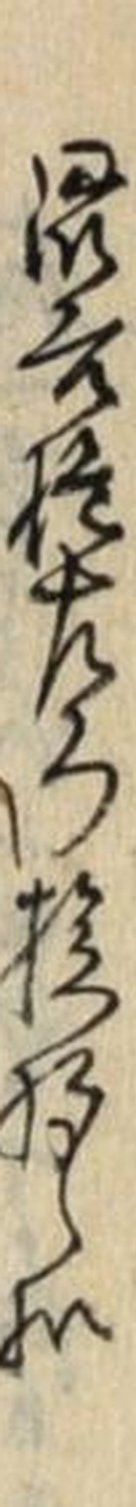渋谷権左衛門挨拶之扣
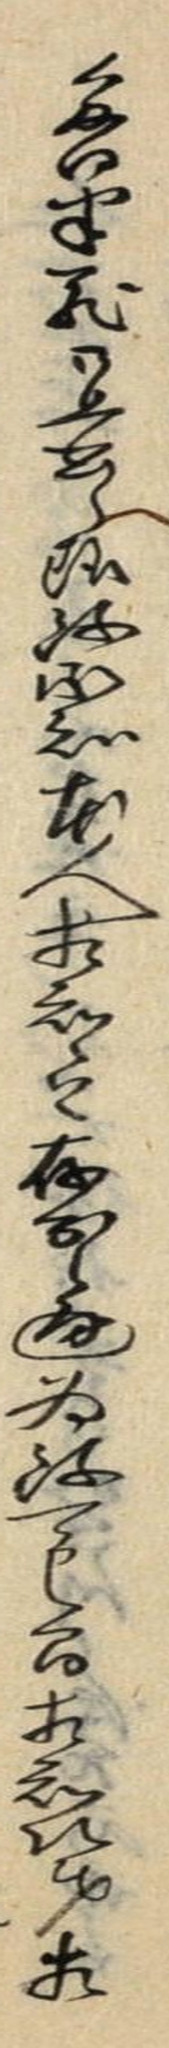多田半蔵口上書之趣致承知本人相知候はゝ存念之通為致可申候間相知次第相
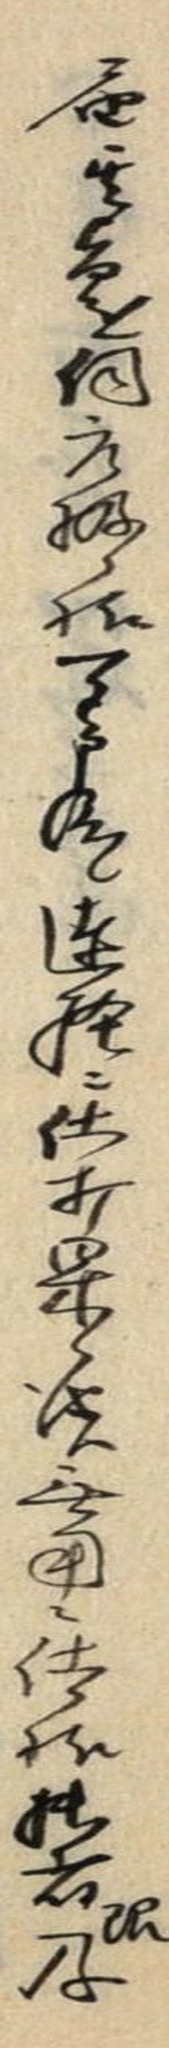届其旨を伺取扱候様可被申渡候達捨に仕打果候儀は無用に仕候様拙者限及
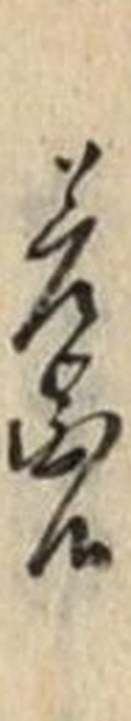差図候
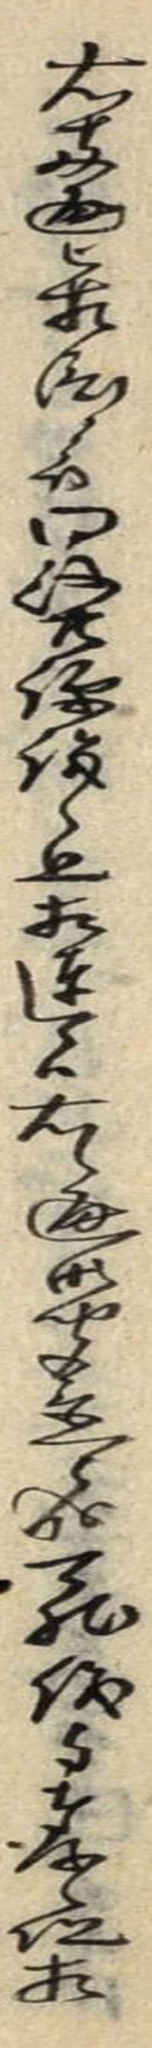右両通被相渡候に付同役共評議之上相達候は右之通御聞置被成可然儀と奉存候但相
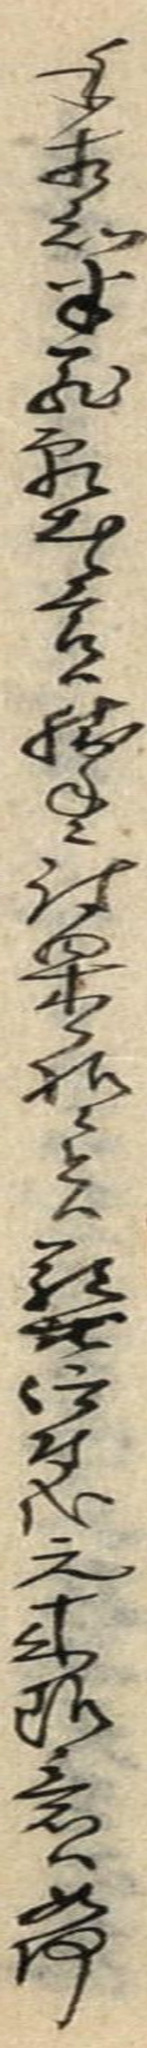手相知半蔵願出候節は勝手に討果候様にとは難被仰付哉元来趣意は如何
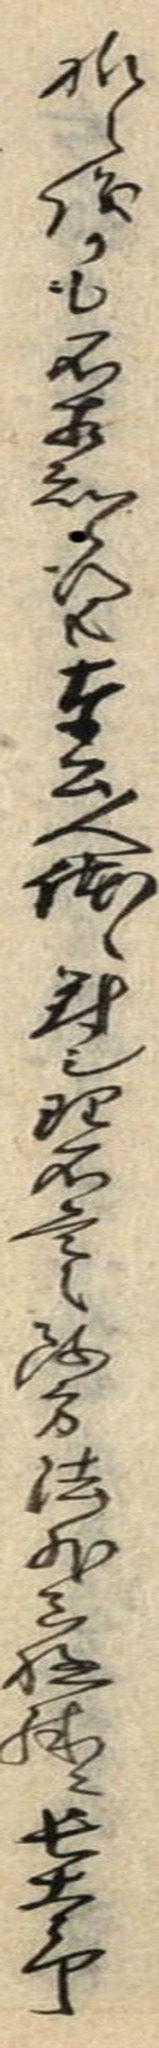様之儀かも不相知候得共奉公人体へ対シ理不尽之致方法外至極殊に長太郎
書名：御停止異変死失
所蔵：福井県文書館 Fukui Prefectural Archives
